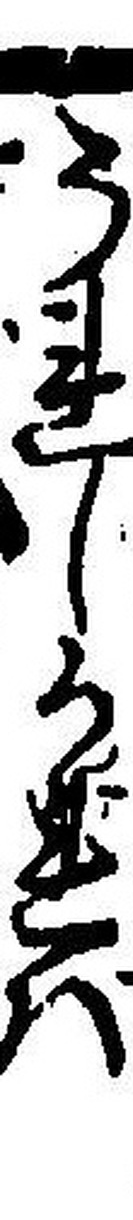うれしかれは
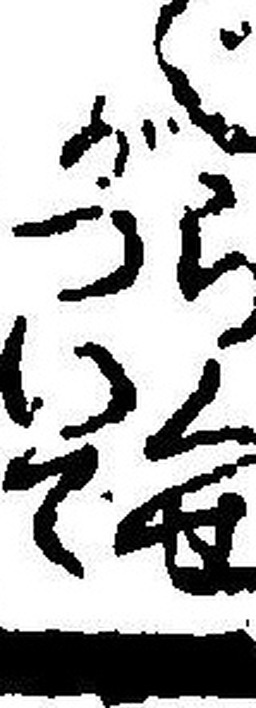がついて
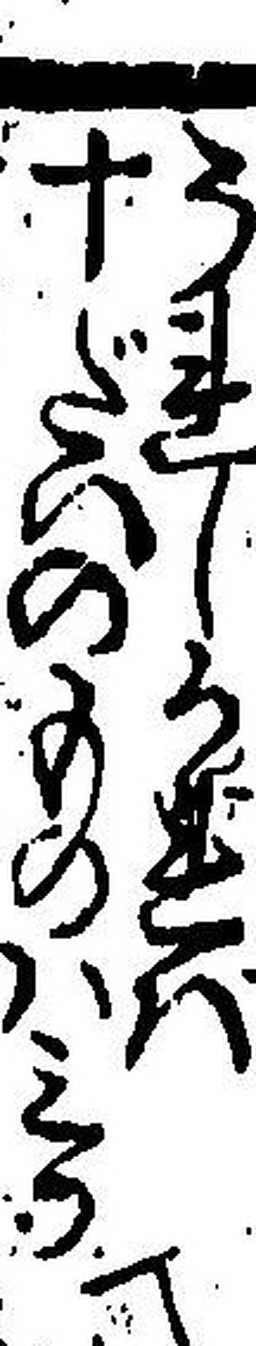十だいのものは三つ
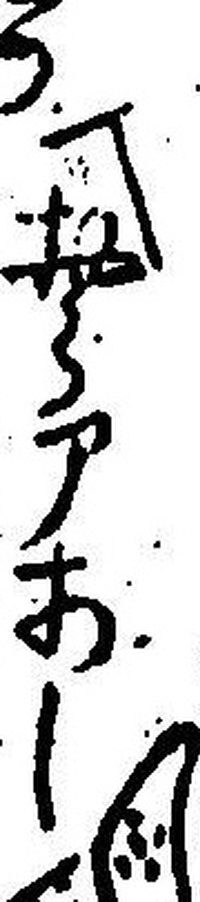〽おらァあし
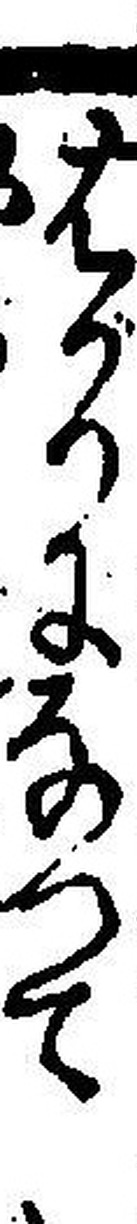はかりになつて
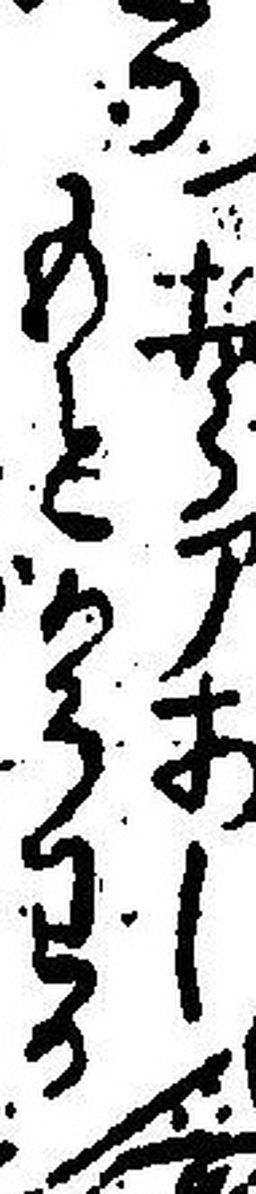もとからわか
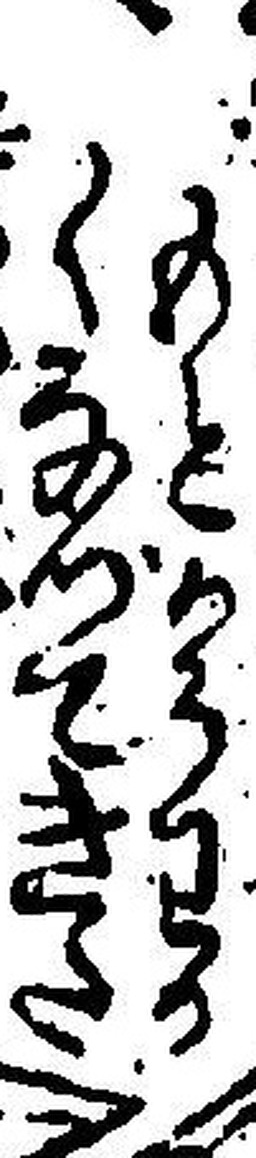くなつてきた
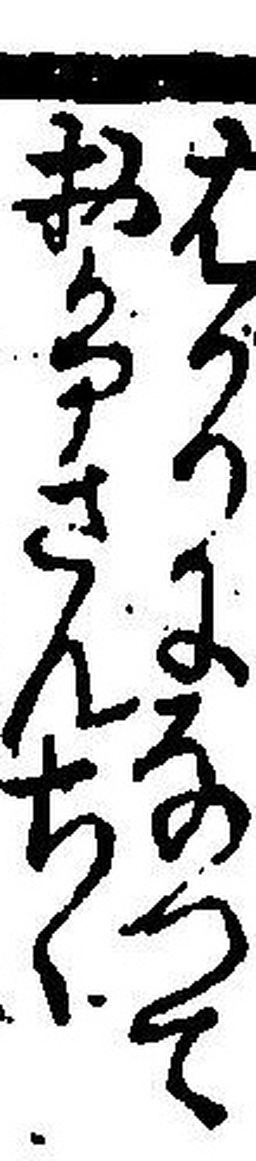おかアさんちゝ
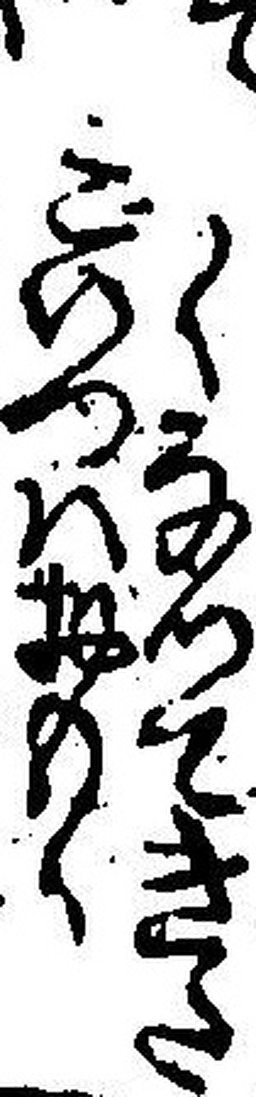こいつはおもく
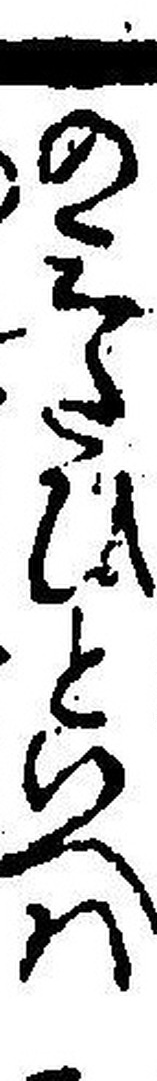のみたひといへは
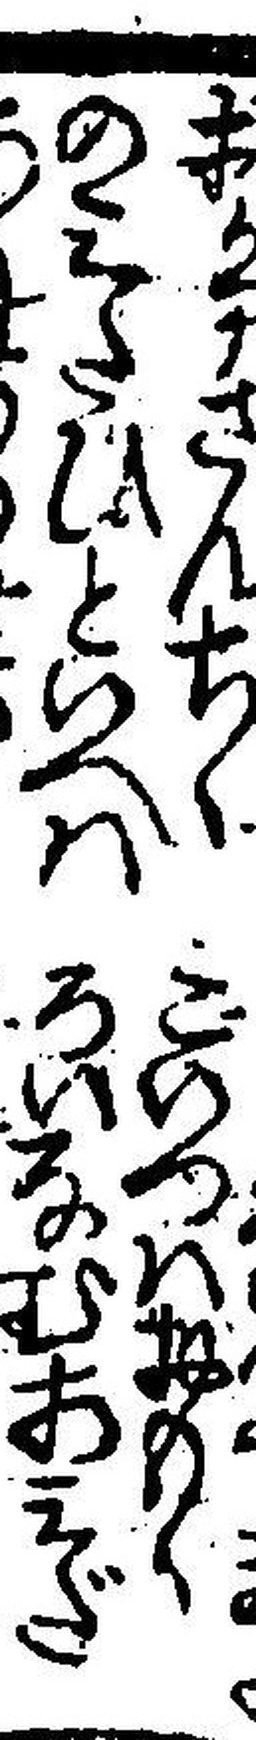のみたひといへは
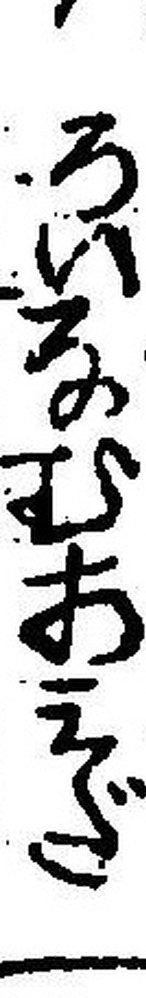ろいななむあみだ
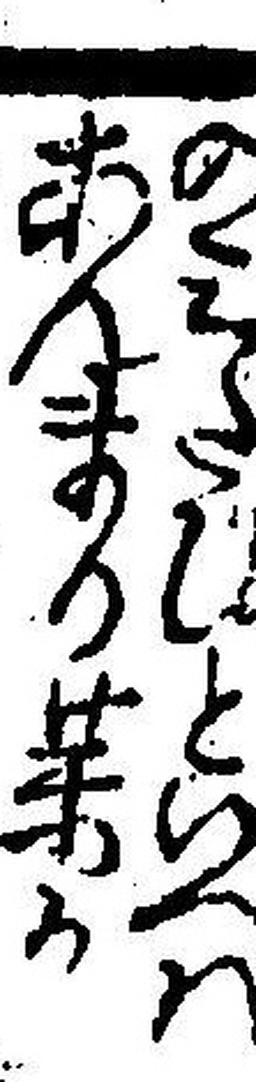あんまり薬か
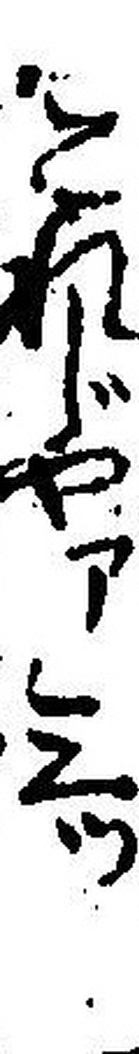これじやァ三つ
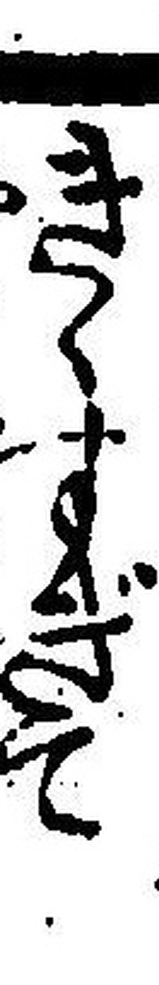きゝすぎて
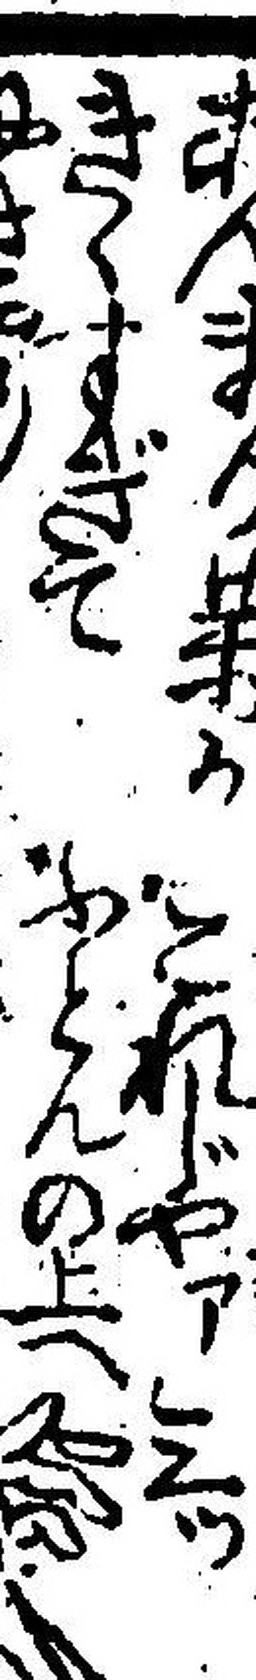きゝすぎて
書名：徳若水縁起金性 / 樹下石上作
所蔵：東京大学総合図書館 General Library in the University of Tokyo, JAPAN
